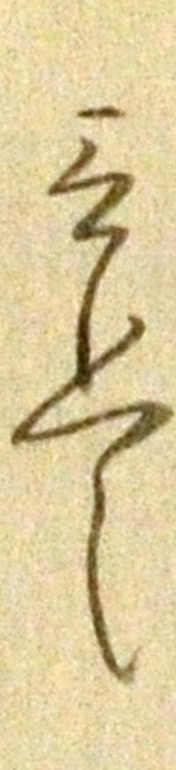言上之
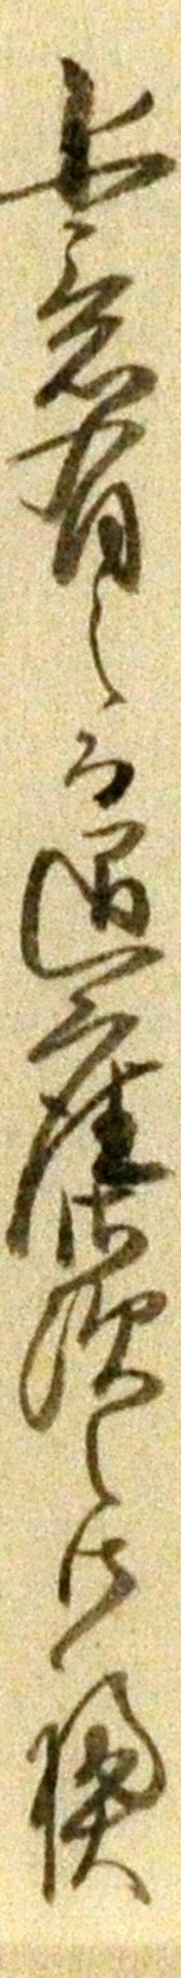上意有之而退座御次之御襖
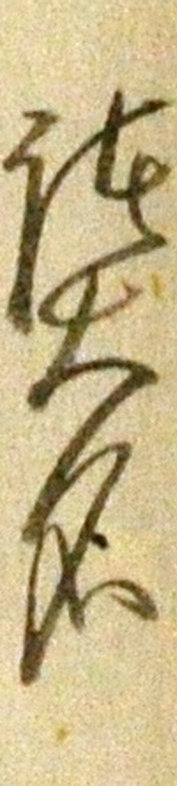諸大名
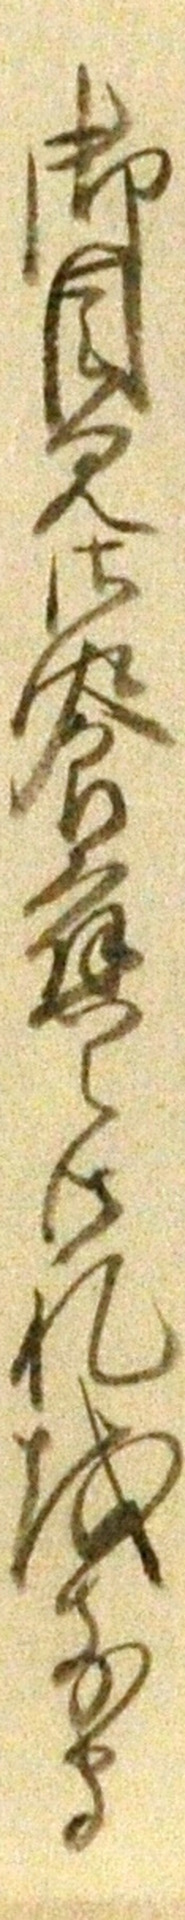御目見御饗応之御礼越前守
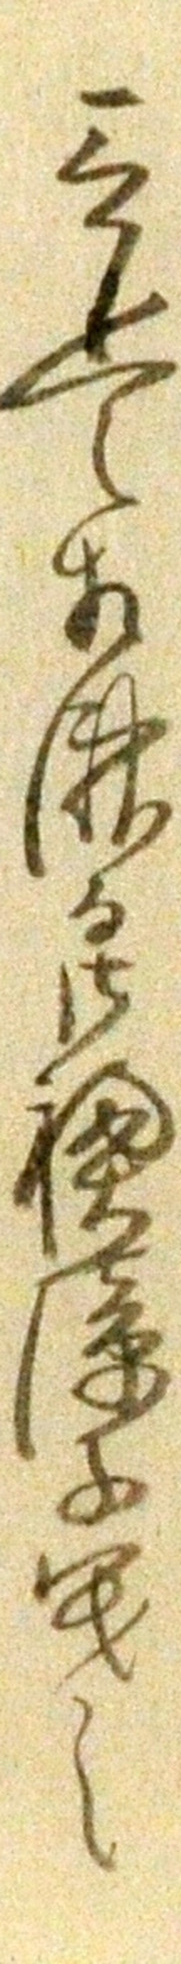言上之相済而御襖障子閉之
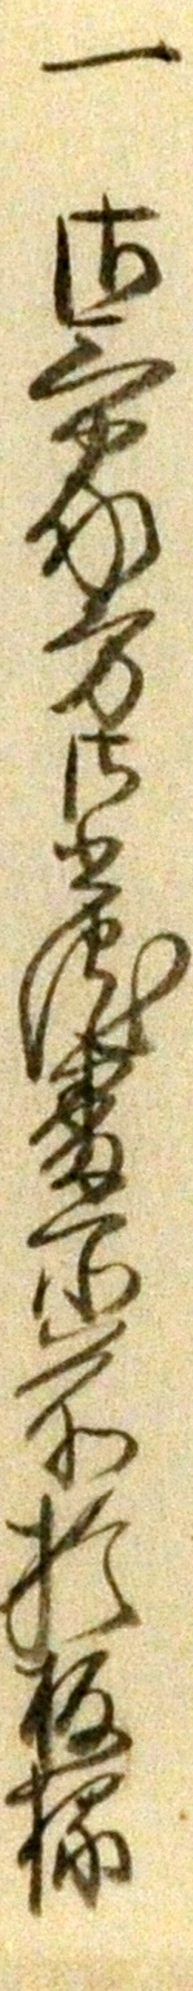一御三家方御書院番所前於板椽
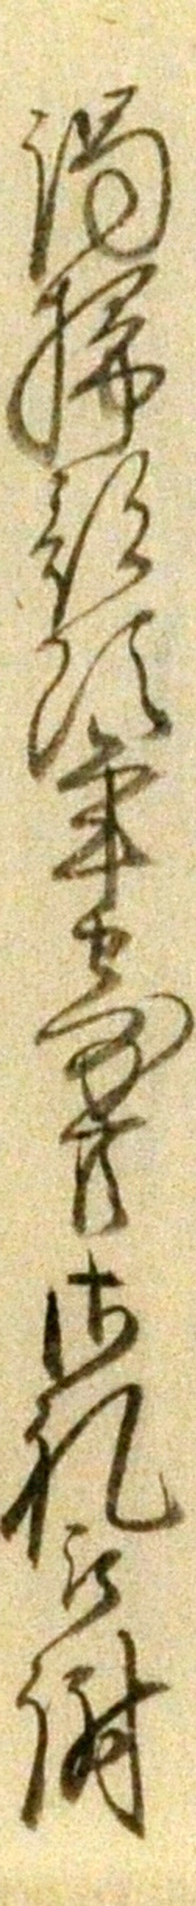謁掃部頭年寄共御礼被謝
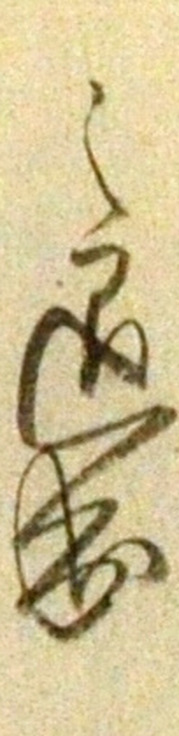之退出
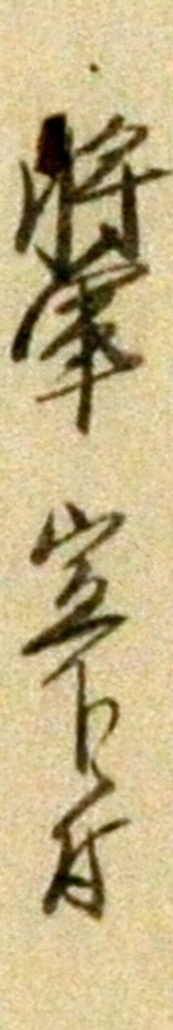将軍宣下ニ付
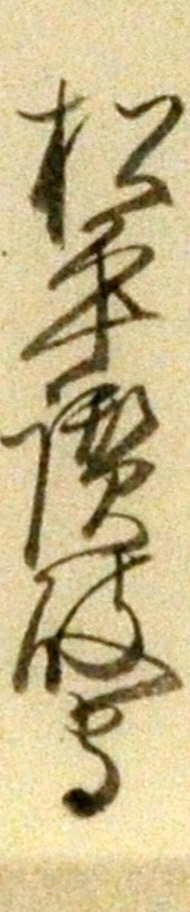松平讃岐守
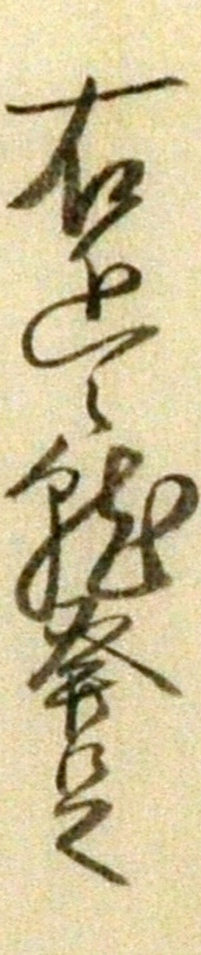右近々就発足
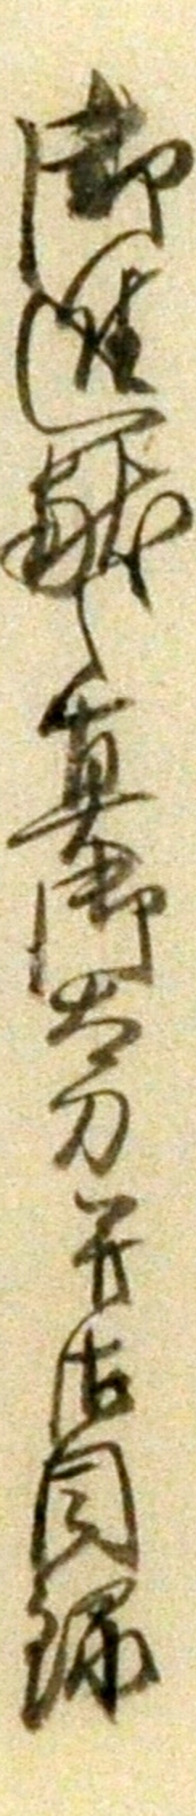御進献之真御太刀并御目録
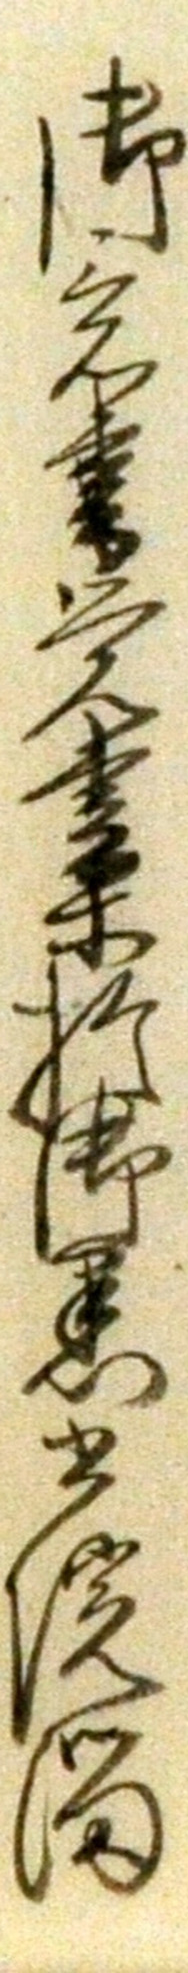御意書覚書等於御黒書院溜

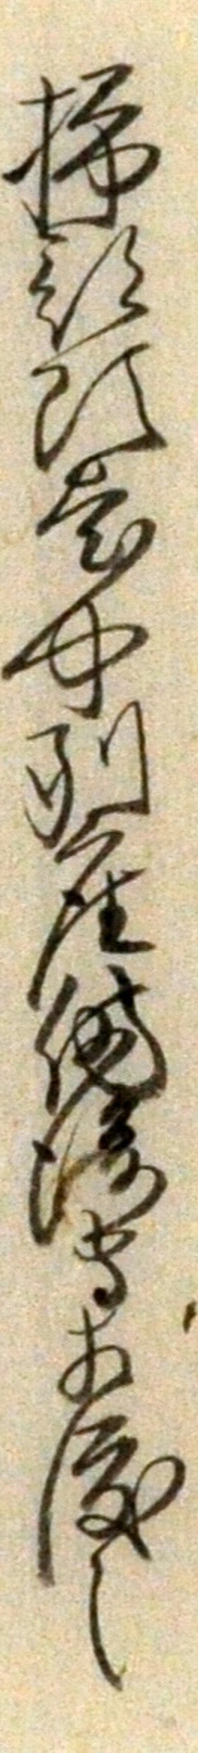掃部頭老中列座備後守相渡之
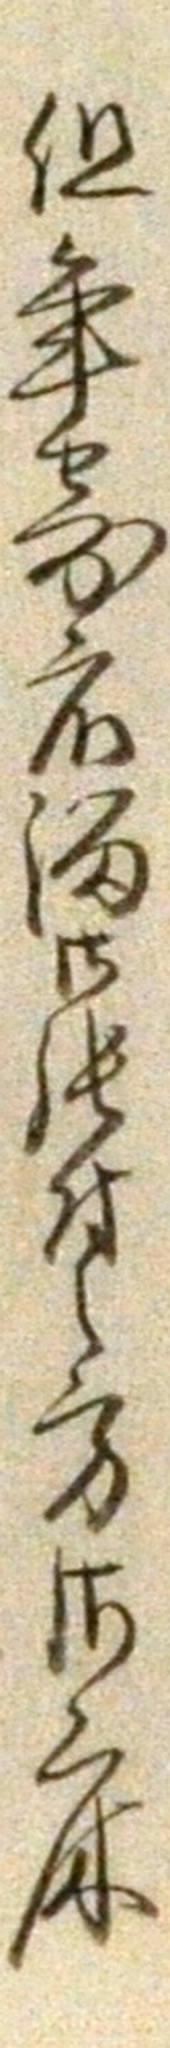但年寄衆溜御張付之方御床
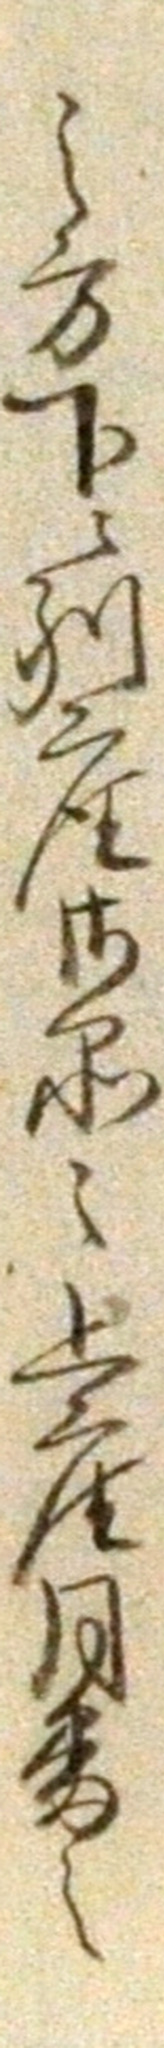之方下ニ列座御品々上座同番之
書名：御馳走御能ノ節ノ留外
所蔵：伊那市立高遠町図書館・合同会社AMANE
